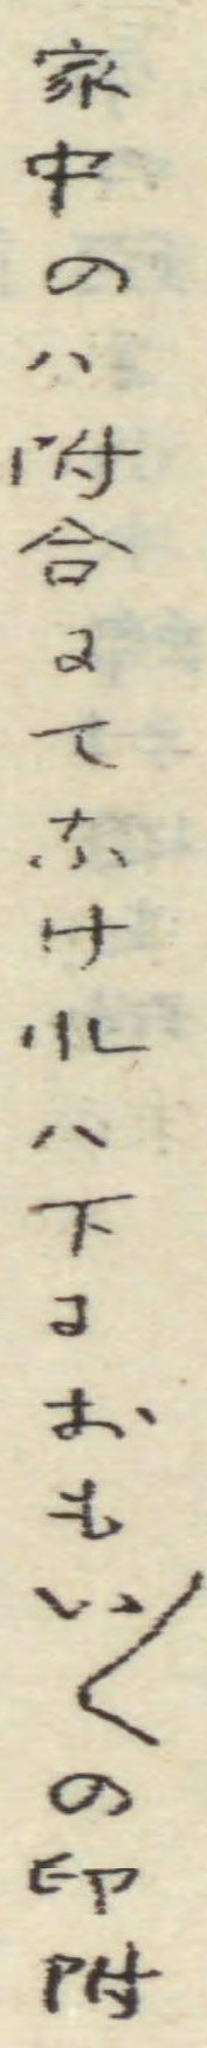家中のハ附合にてなけれハ下におもい〳〵の印附
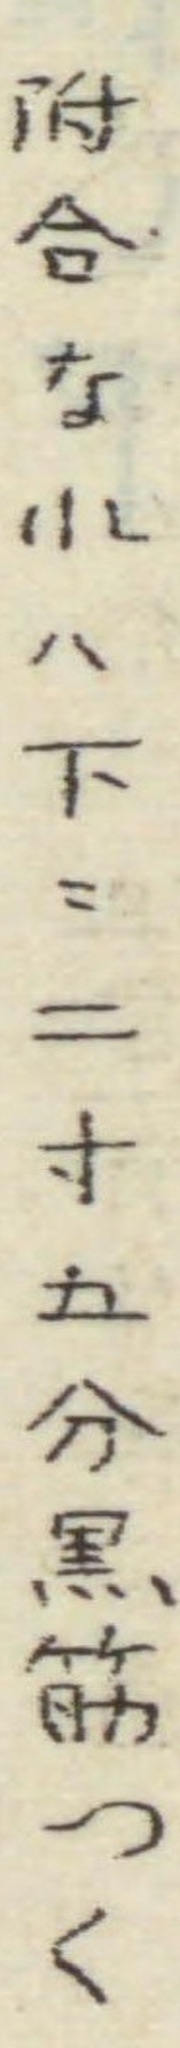附合なれハ下二二寸五分黒筋つく
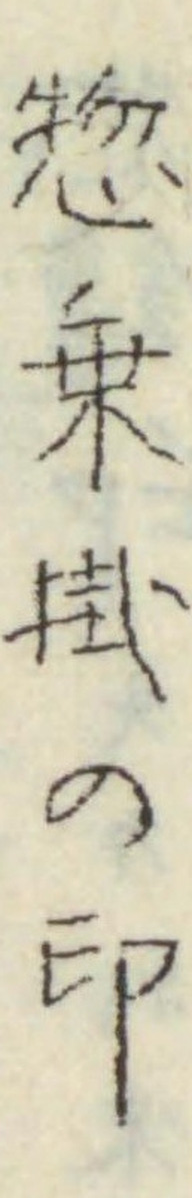惣乗掛の印
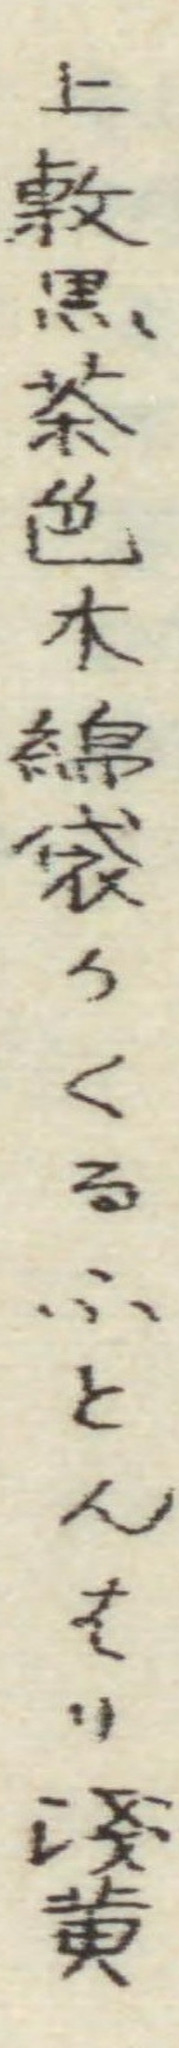上敷黒茶色木綿袋かくるふとんはり浅黄
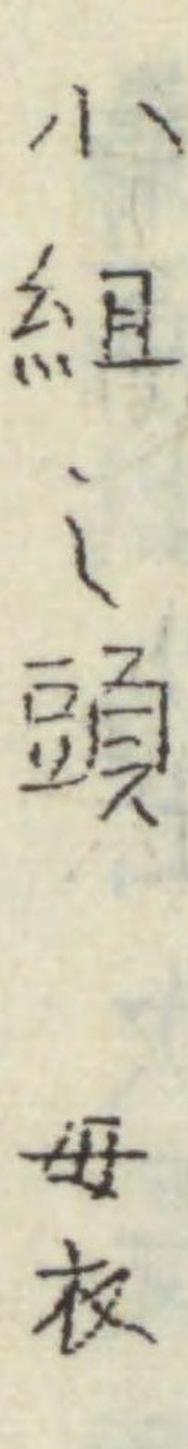小組之頭母衣
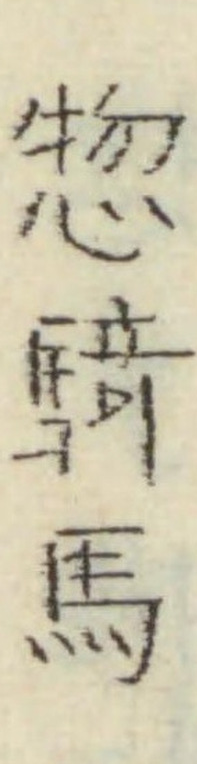惣騎馬
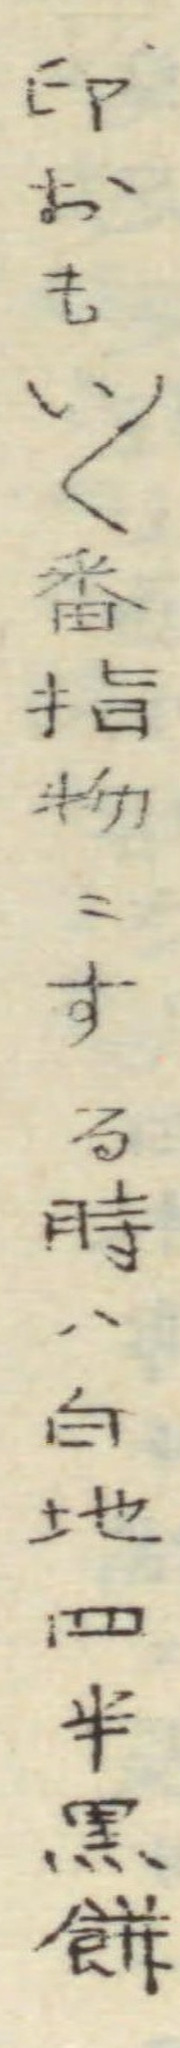印おもい〳〵番指物二する時ハ白地四半黒餅
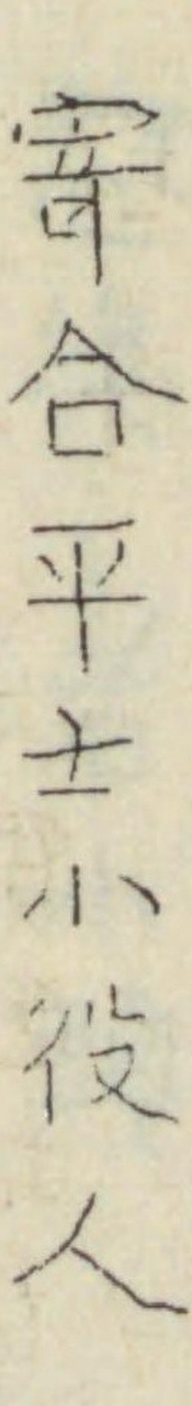寄合平士小役人
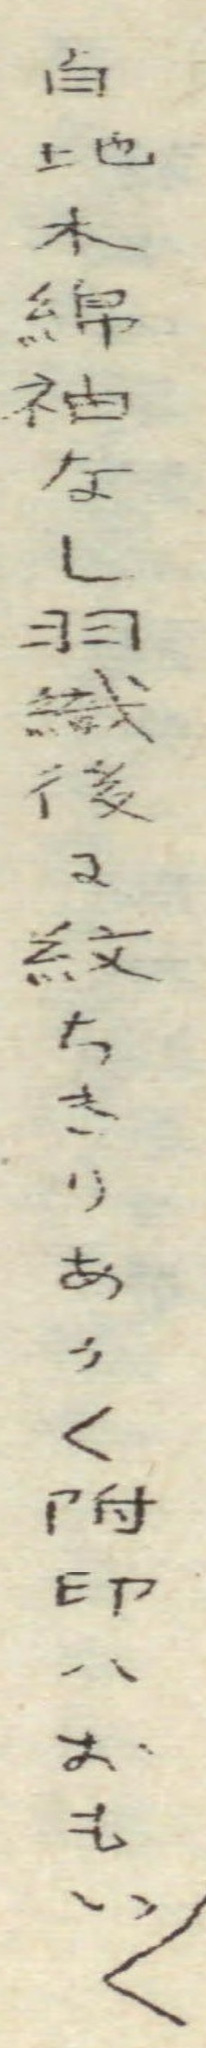白地木綿袖なし羽織後に紋ちきりあかく附印ハおもい〳〵
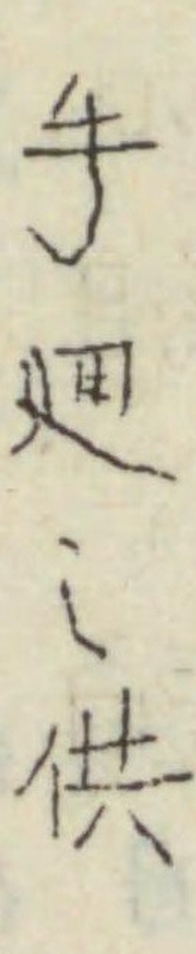手廻之供
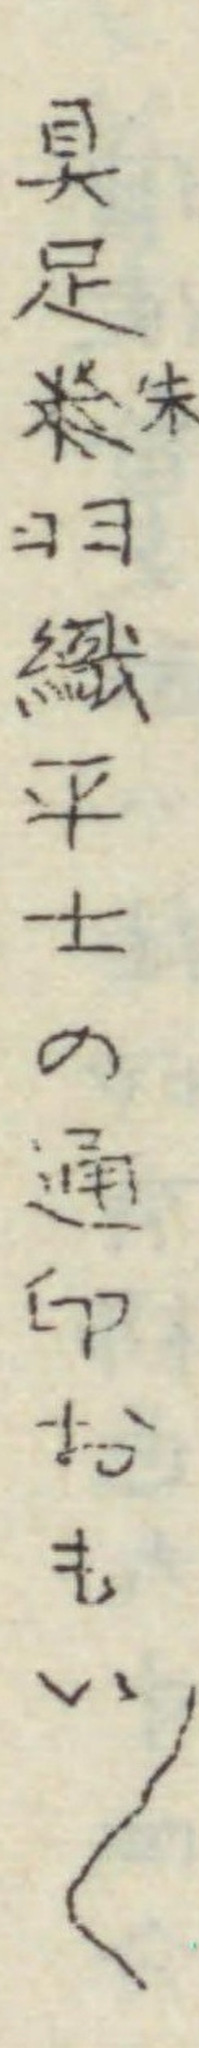具足朱羽織平士の通印おもい〳〵
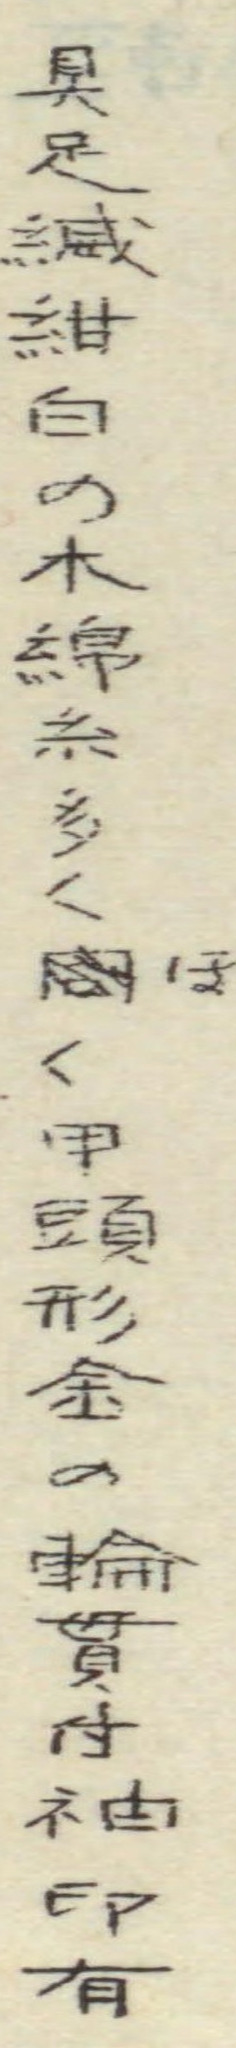具足縅紺白の木綿糸多くほく甲頭形金の輪貫付袖印有
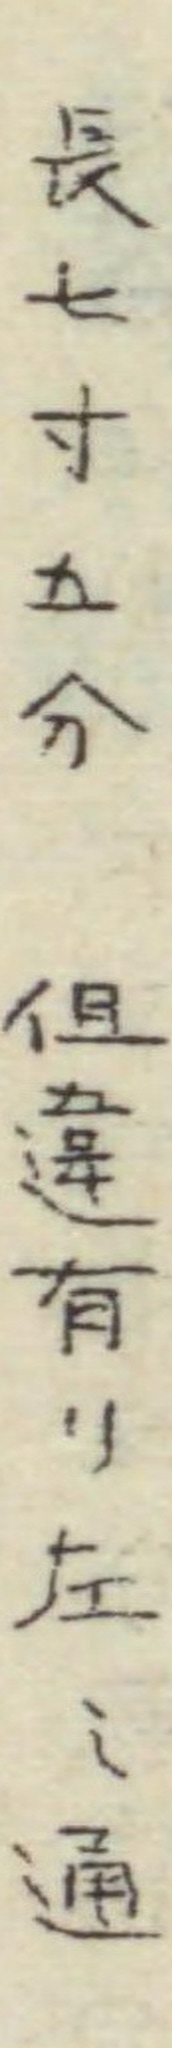長七寸五分但違有り左之通
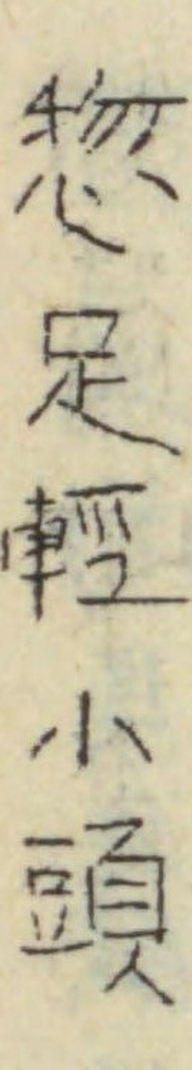惣足軽小頭

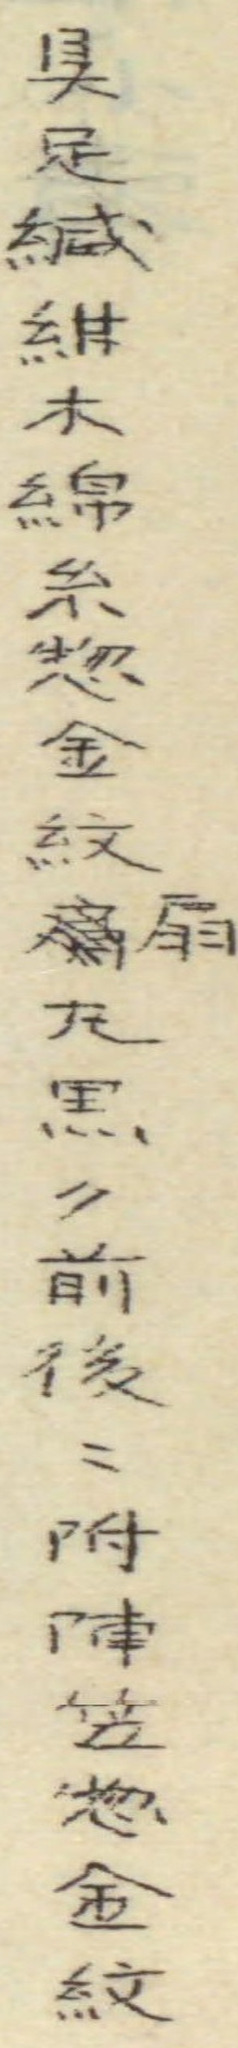具足縅紺木綿糸惣金紋扇丸黒ク前後二附陣笠惣金紋
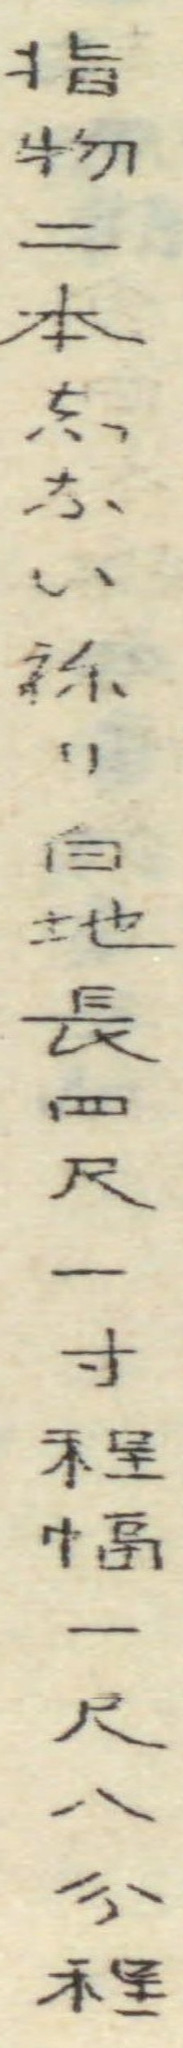指物二本こないねり白地長四尺一寸程幅一尺八分程
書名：三河吉田藩動員史料
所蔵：国立国会図書館 National Diet Library, JAPAN
